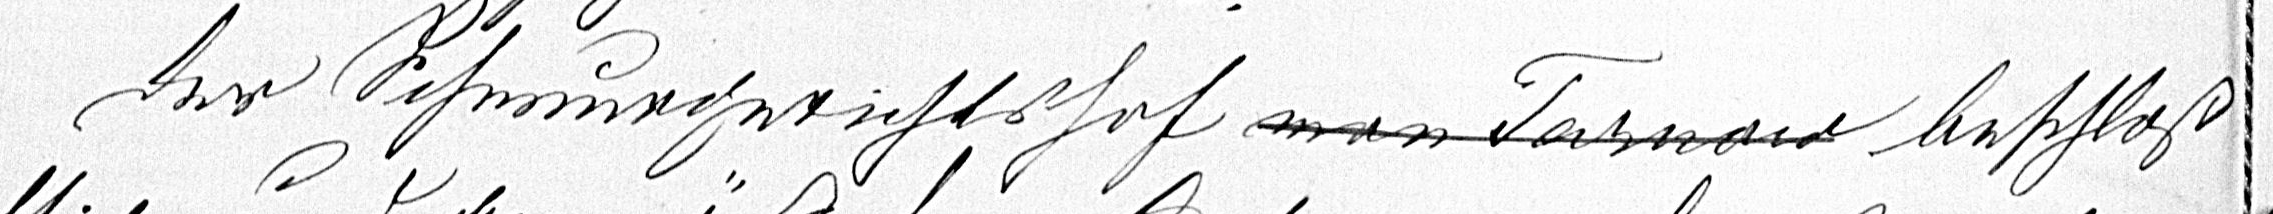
Der Schwurgerichtshof beschloß
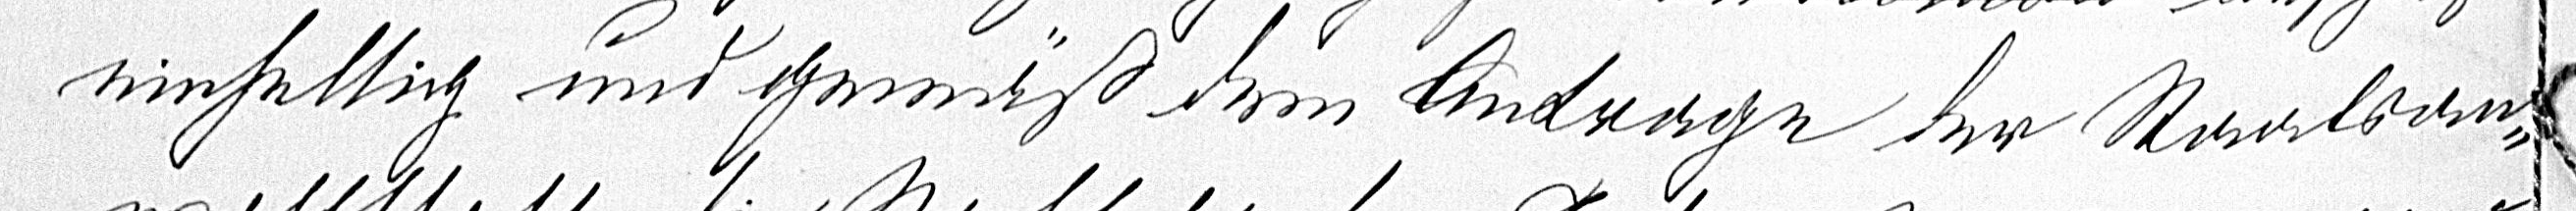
einhellig und gemäß dem Antrage der Staatsan¬
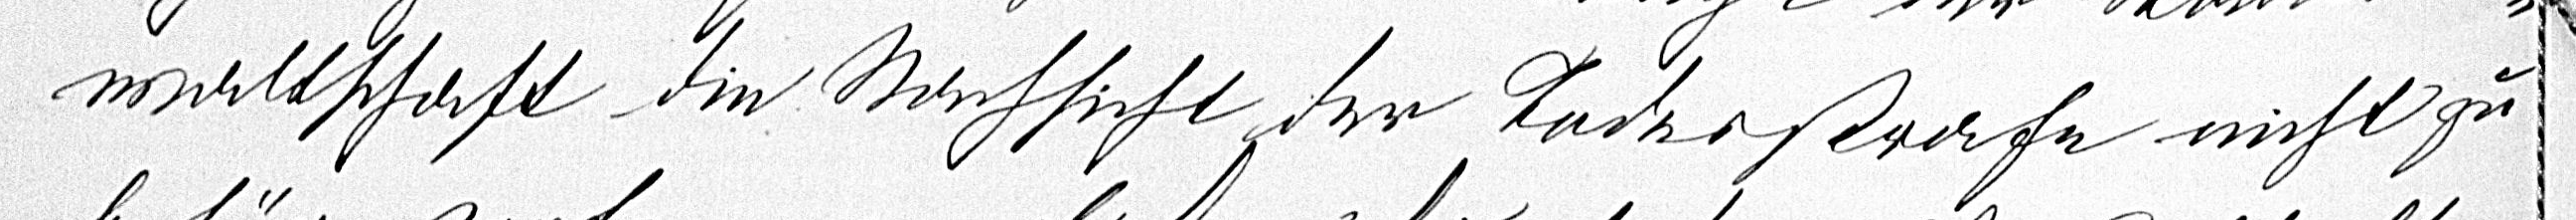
waltschaft die Nachsicht, der Todesstrafe nicht zu
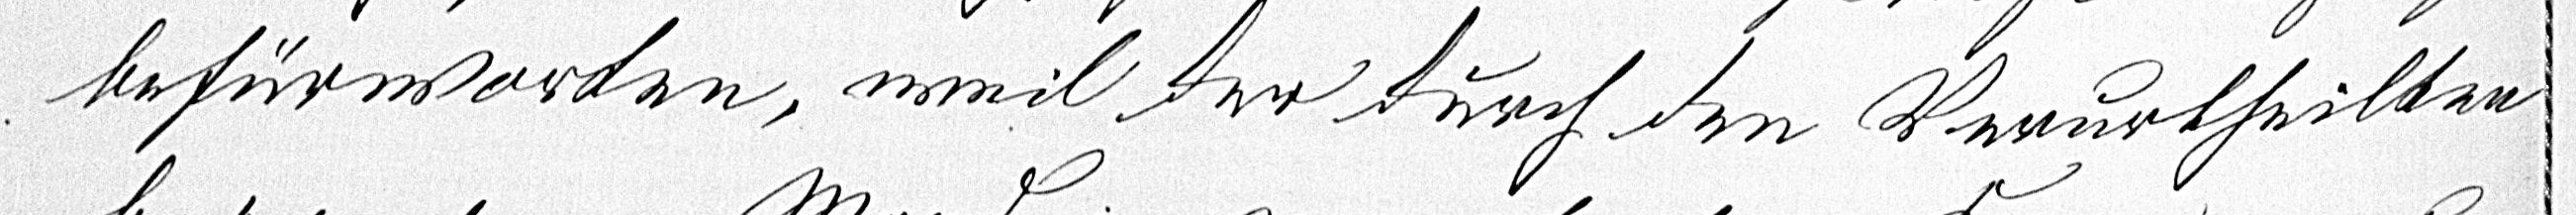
befürworten, weil der durch den Verurtheilten
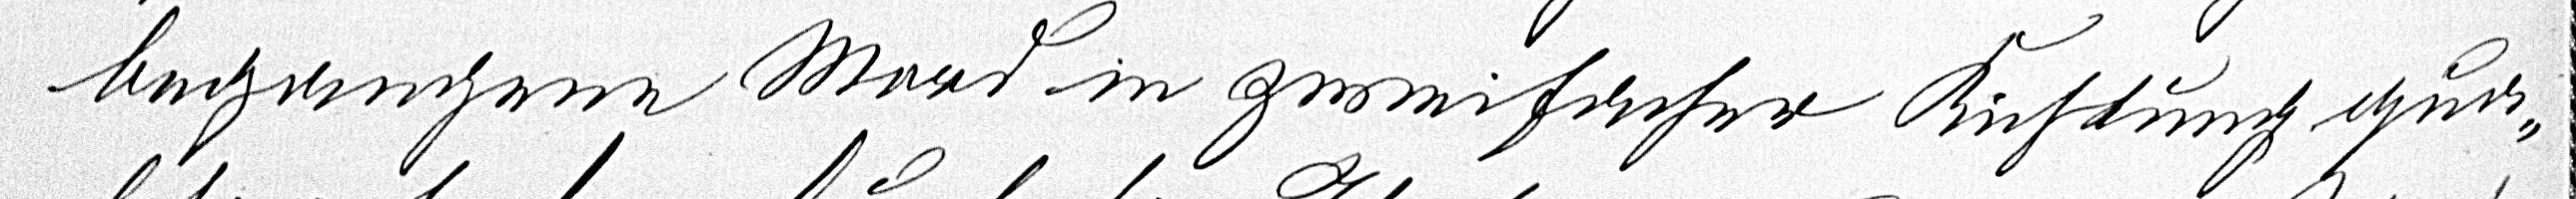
begangene Mord zweifacher Richtung qua¬
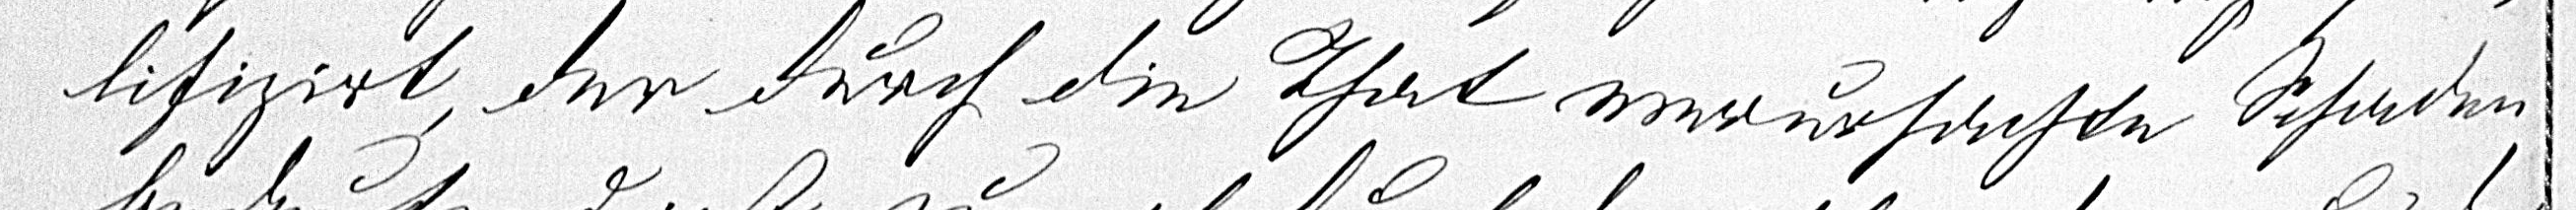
lifizirt, der durch die That verursachte Schaden
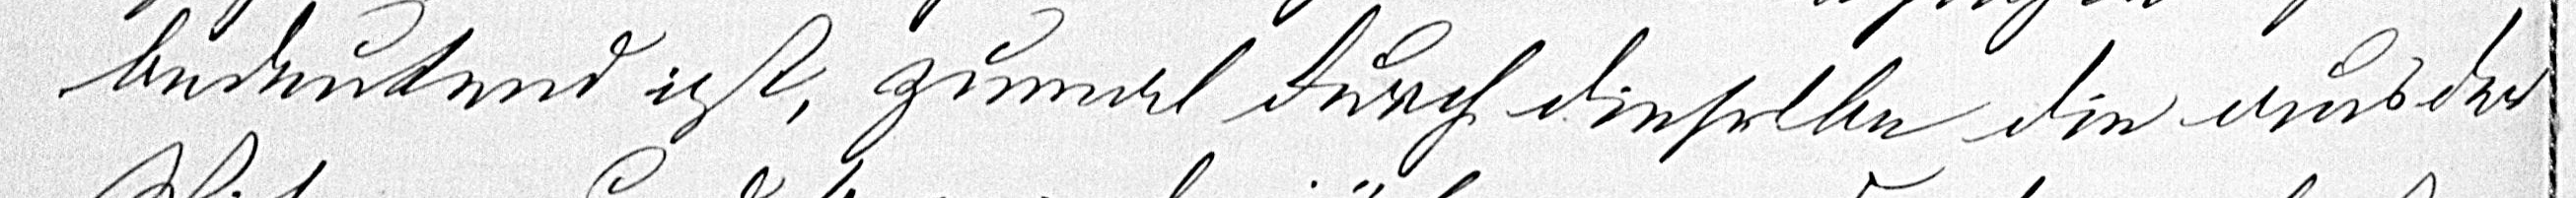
bedeutend ist, zumal durch dieselbe die aus der
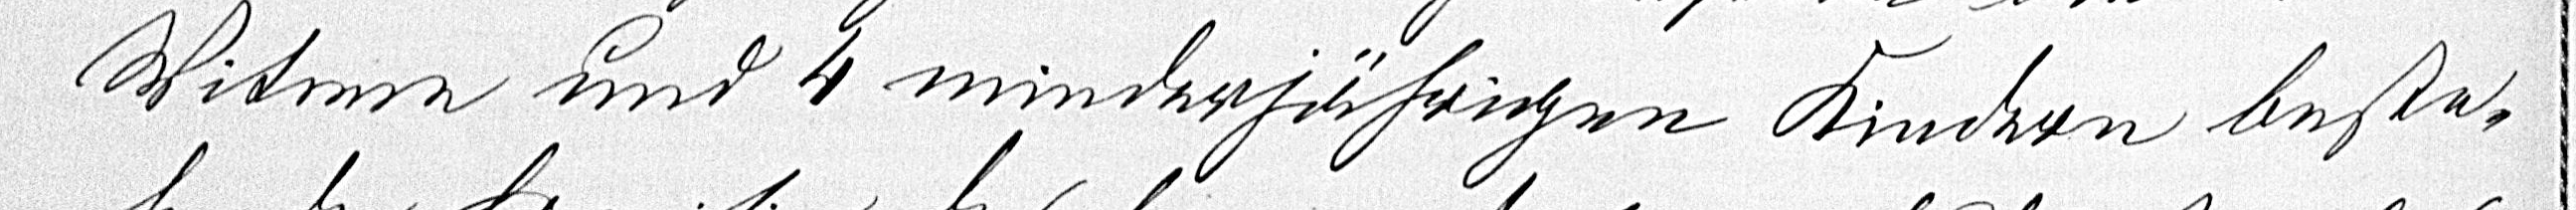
Witwe und 4 minderjährigen Kindern beste¬
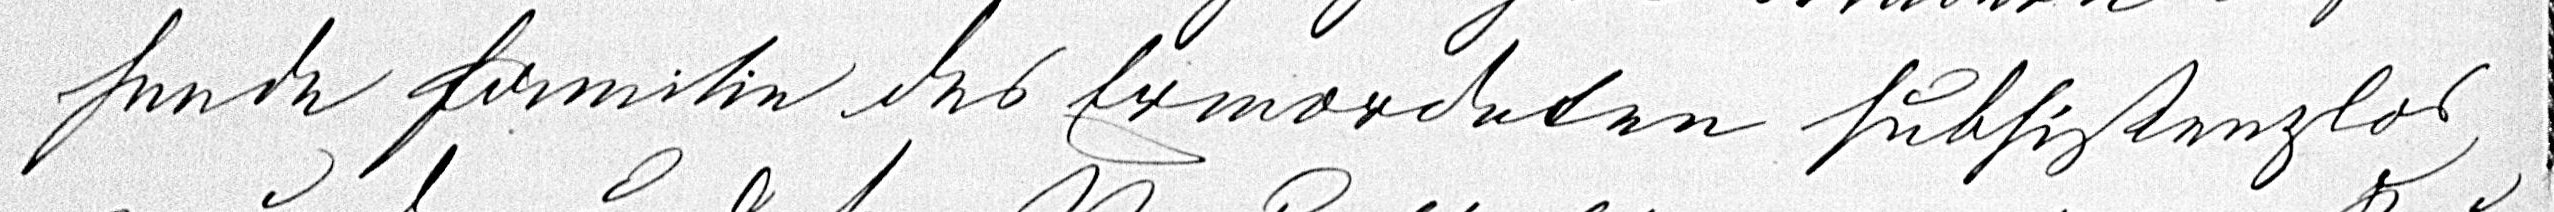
hende familie des Ermordeten subfißenzlos
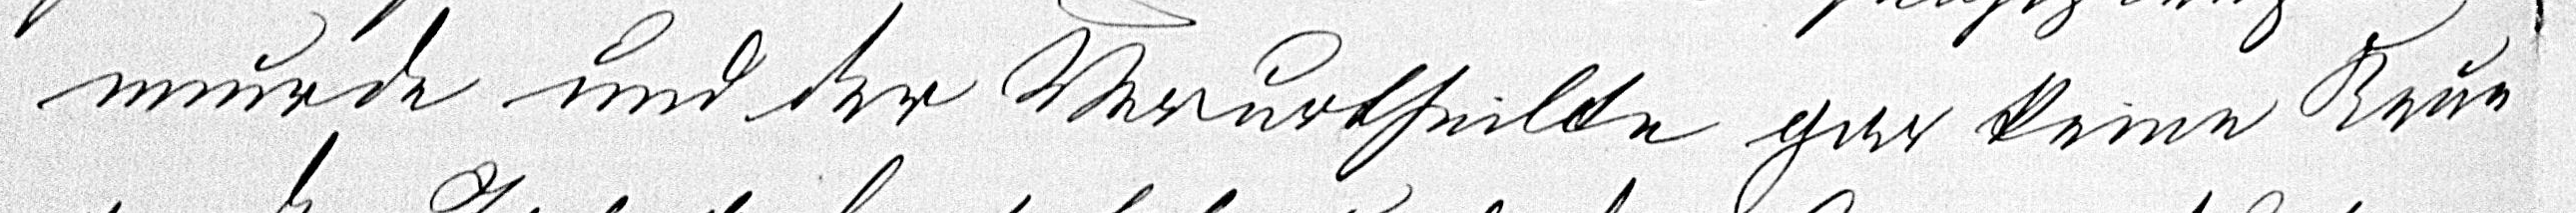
wurde und der Verurtheilte gar keine Reue
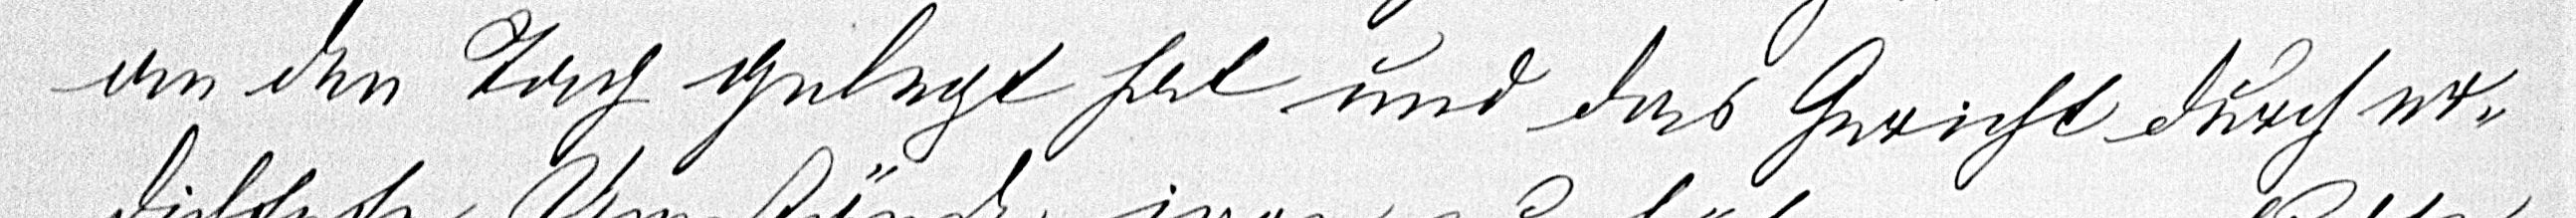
an den Tag gelegt hat und das Gericht durch er¬
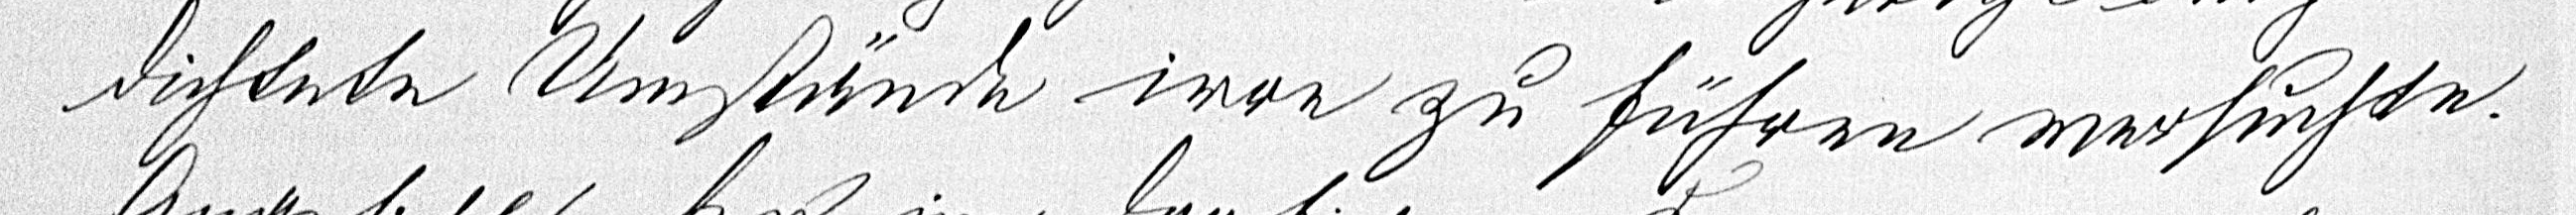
dichtete Umstände irre zu führen versuchte.
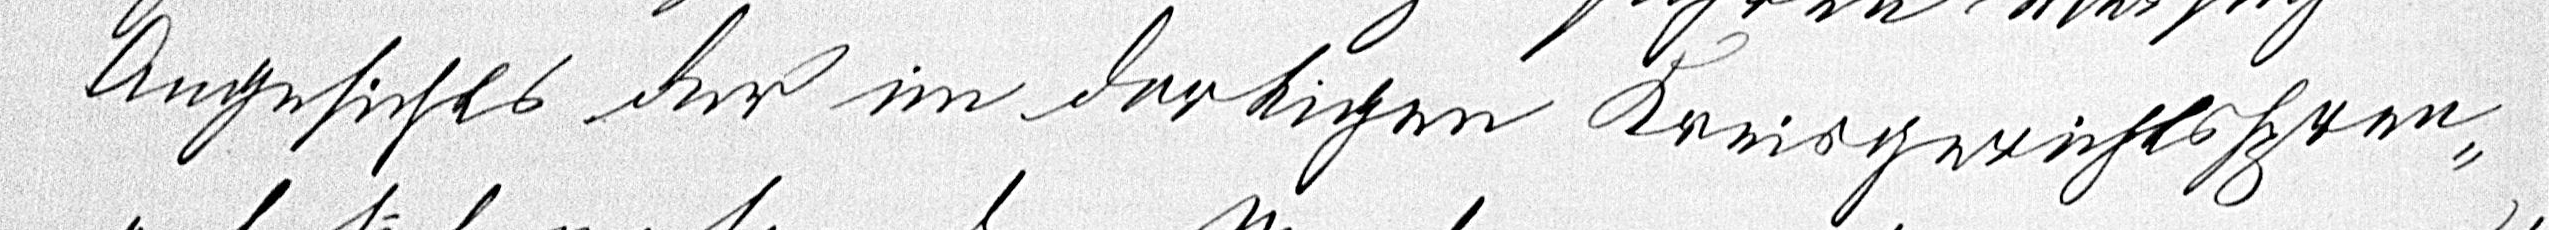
Angesichts der im dortigen Kreisgerichtsspren¬
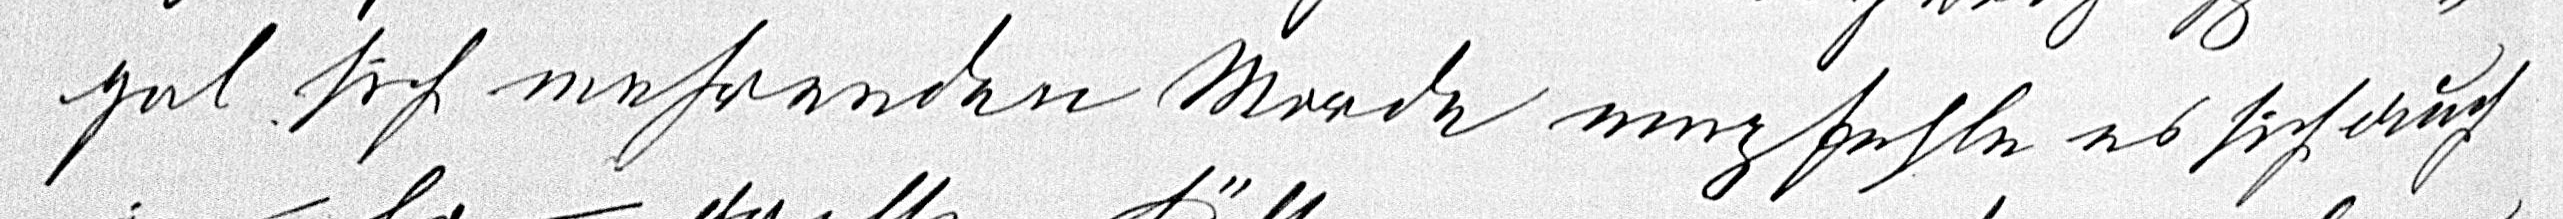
gel sich mehrenden Morde empfehle es sich auch
